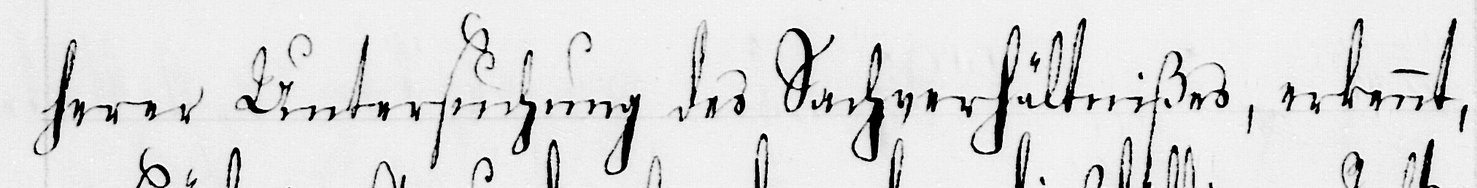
herer Untersuchung des Sachverhältnißes, erkenn¬
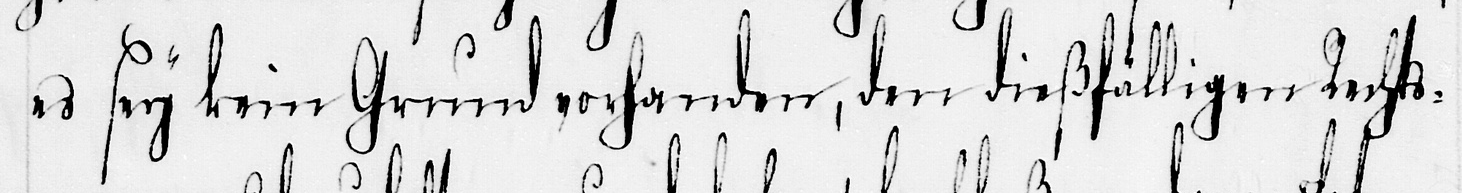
es sey kein Grund vorhanden, den dießfälligen Rechts¬
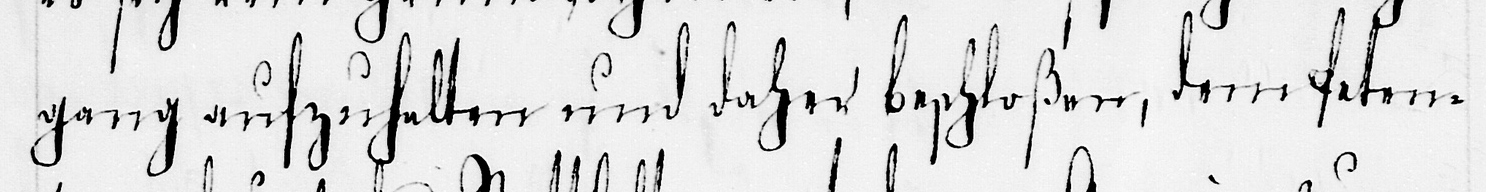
gang aufzuhalten und daher beschloßen, dem Peten¬
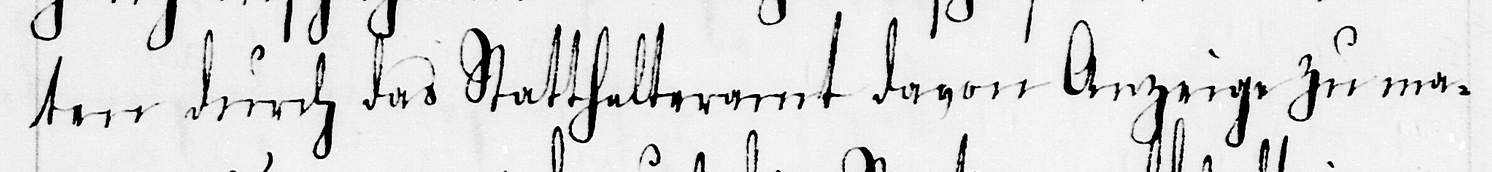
ten durch das Statthalteramt davon Anzeige zu ma¬
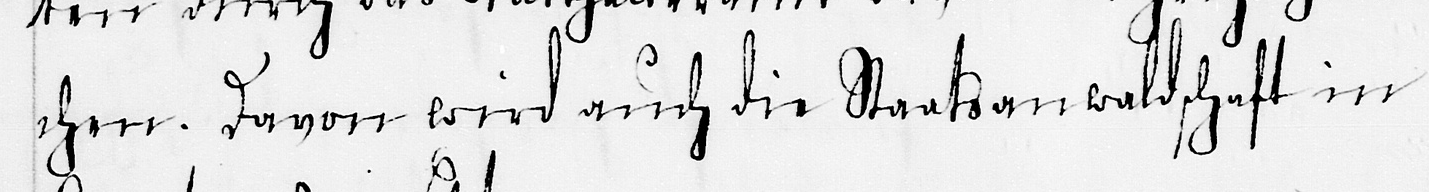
chen. Davon wird auch die Staatsanwaldschaft in
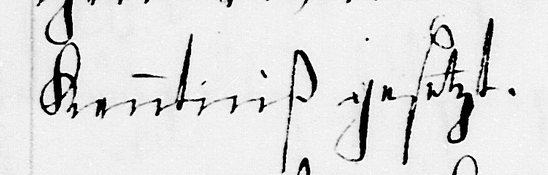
Kenntniß gesetzt.
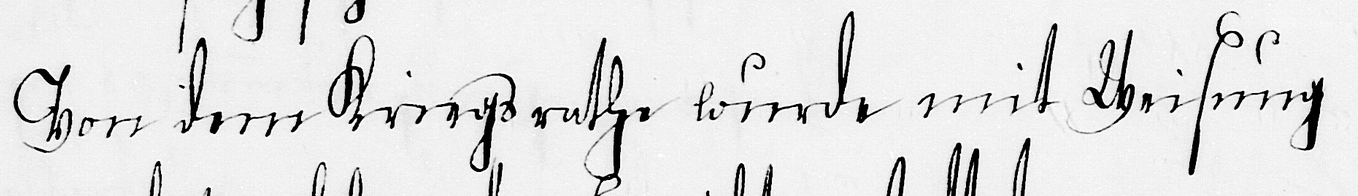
Von dem Kriegsrathe wurde mit Weisung
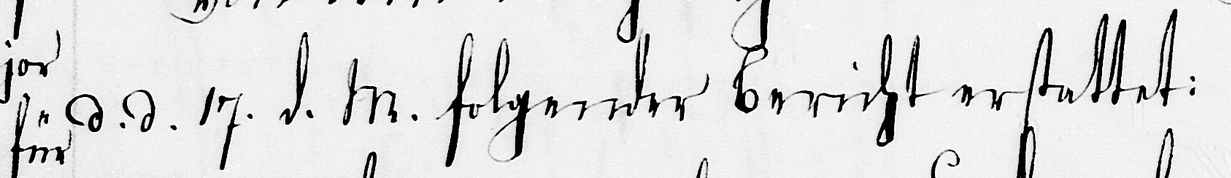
d. d. 17. d. M. folgender Bericht erstattet:
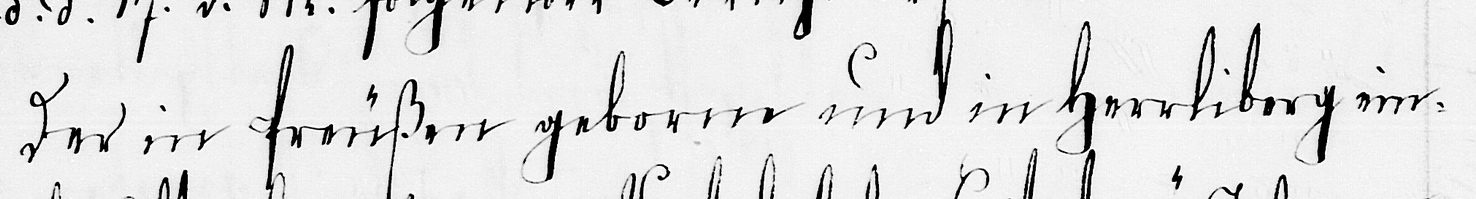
Der in Preußen geborne und in Herrliberg ein¬
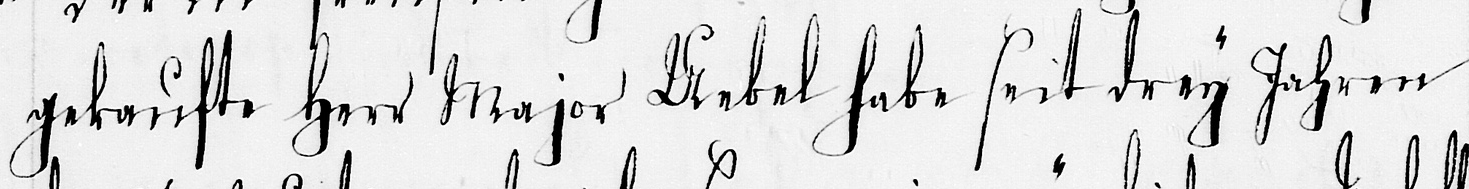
gekaufte Herr Major Uebel habe seit drey Jahren
